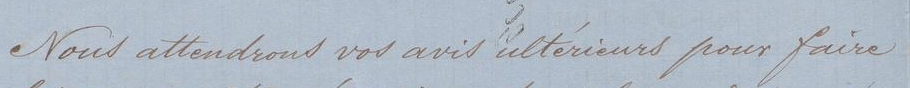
Nous attendrons vos avis ultérieurs pour faire
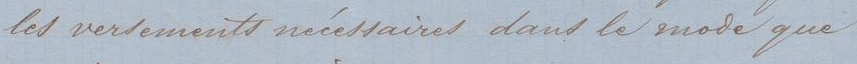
les versements nécessaires dans le mode que
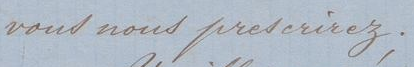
vous nous prescrirez.
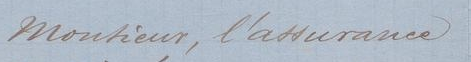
Monsieur, l'assurance
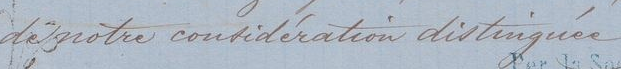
de notre considération distinguée
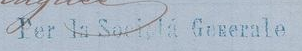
Per la Società Generale
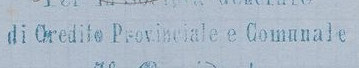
di Credito Provinciale e Comunale
